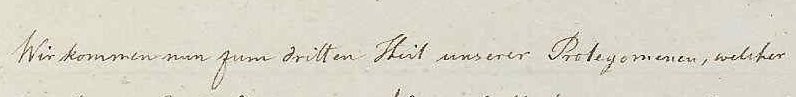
Wir kommen nun zum dritten Theil unserer Prolegomenen, welcher
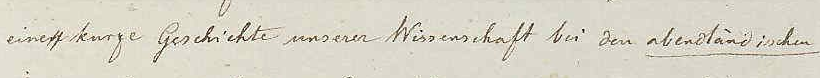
einen kurze Geschichte unserer Wissenschaft bei den abendländischen
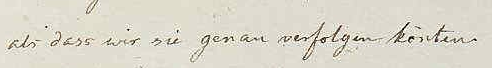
als dass wir sie genau verfolgen könten.
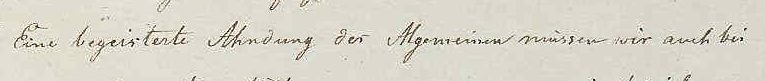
Eine begeisterte Ahndung des Algemeinen müssen wir auch bei
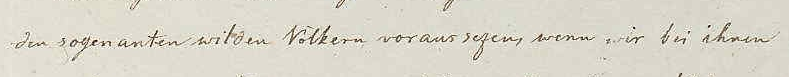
den sogenanten wilden Völkern voraussezen, wenn wir bei ihnen
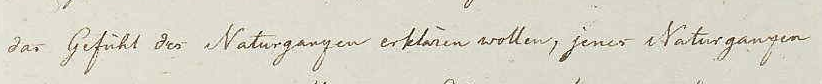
das Gefühl des Naturganzen erklären wollen, jenes Naturganzen
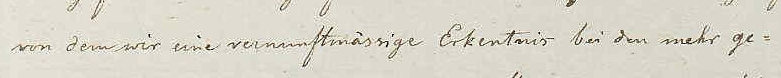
von dem wir eine vernunftmässige Erkentnis bei den mehr ge-
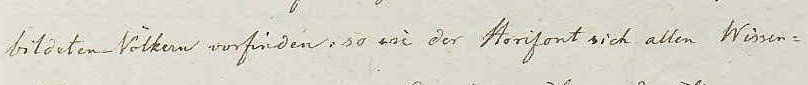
bildeten Völkern vorfinden: so wie der Horizont sich allen Wissen-
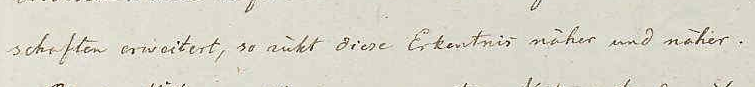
schaften erweitert, so rükt diese Erkentnis näher und näher.
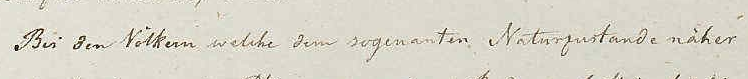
Bei den Völkern welche den sogenanten Naturzustande näher
